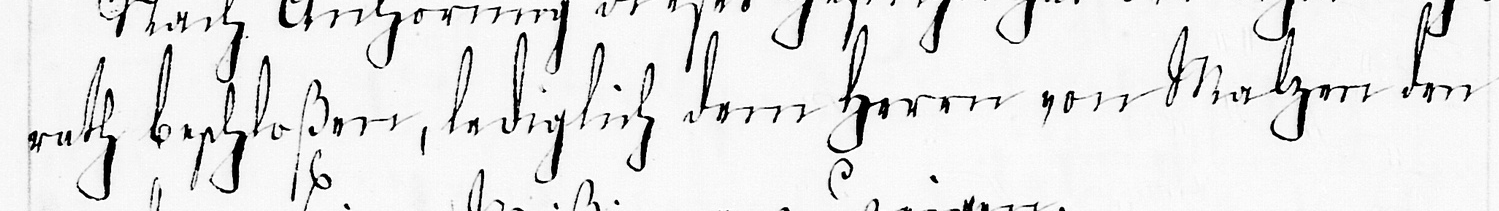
rath beschloßen, lediglich dem Herrn von Malzen den
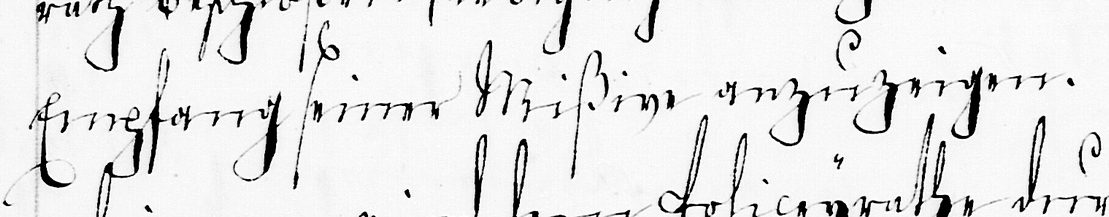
Empfang seiner Mißive anzuzeigen.
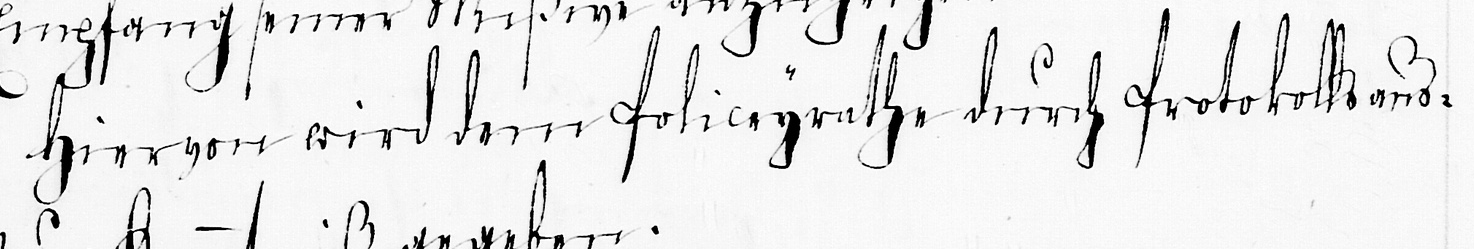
Hiervon wird dem Policeyrathe durch Protokollsau¬
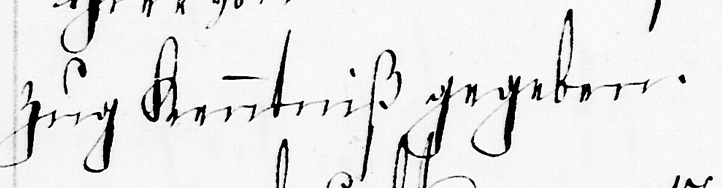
szug Kenntniß gegeben.
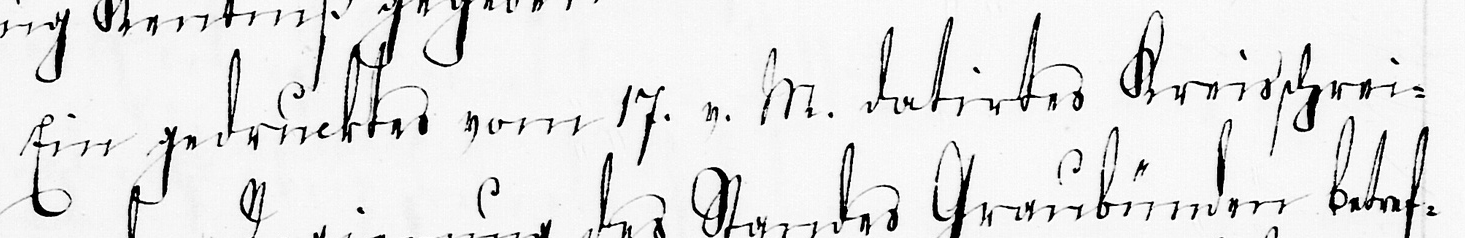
Ein gedrucktes vom 17. v. M. datirtes Kreisschrei¬
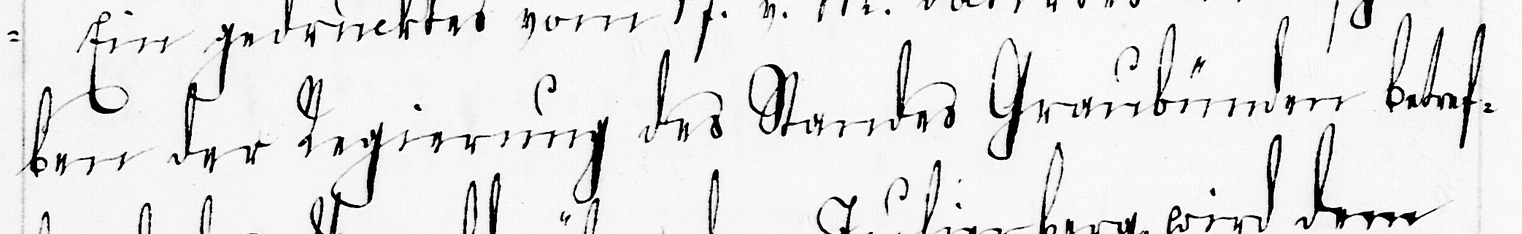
ben der Regierung des Standes Graubünden betref¬
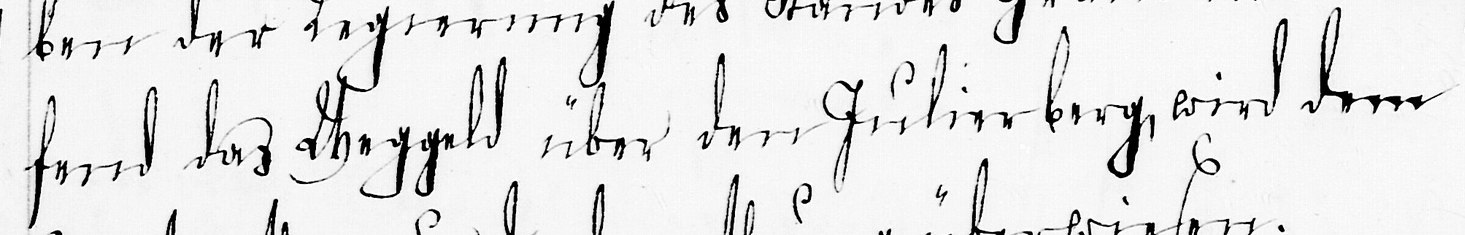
fend das Weggeld über den Julierberg, wird dem
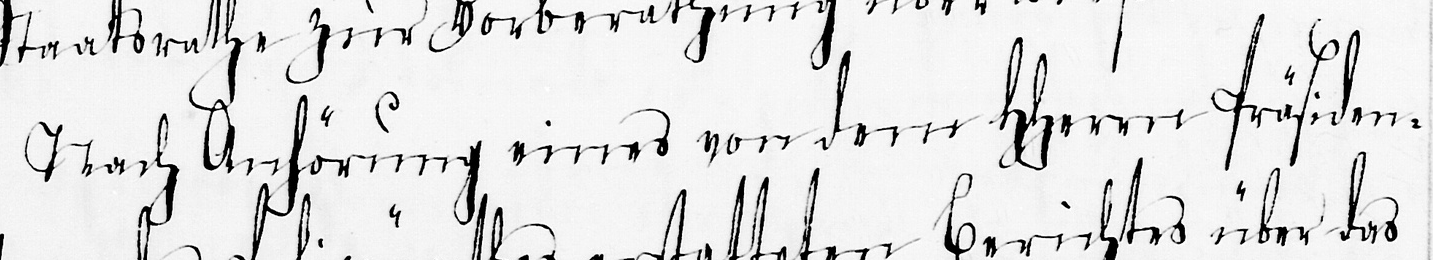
Nach Anhörung eines von dem HHerrn Präsiden¬
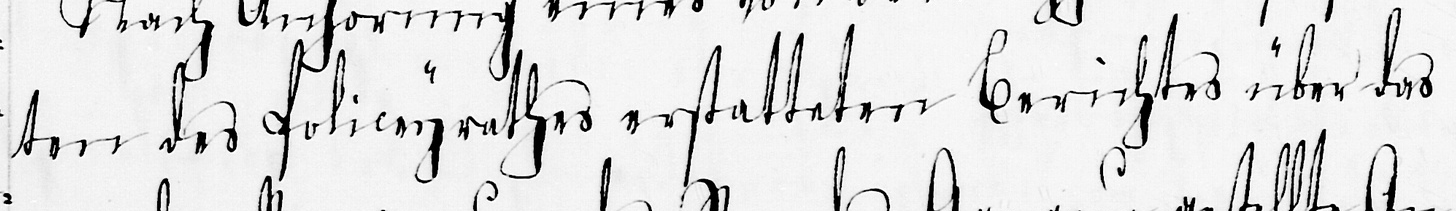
ten des Policeyrathes erstatteten Berichtes über das
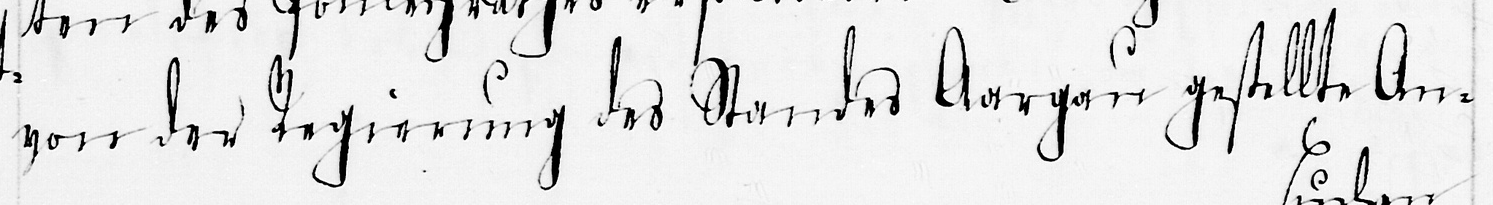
von der Regierung des Standes Aargau gestellte An-
